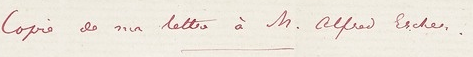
Copie de ma lettre à M. Alfred Escher.
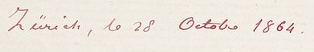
Zürich, le 28 Octobre 1864.
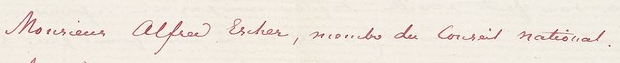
Monsieur Alfred Escher, membre du Conseil national.
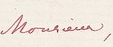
Monsieur,
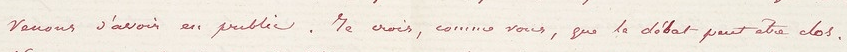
venons d'avoir en public. Je crois, comme vous, que le débat peut être clos.
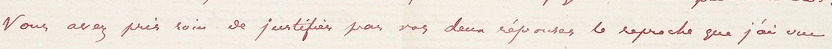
Vous avez pris soin de justifier par vos deux réponses le reproche que j'ai vue
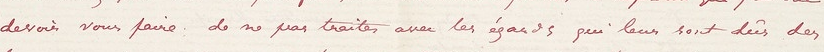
devoir vous faire, de ne pas traiter avec les égards qui leur sont dûs des
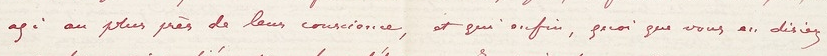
agi au plus près de leur conscience, et qui enfin, quoi que vous en disiez,
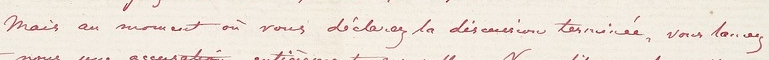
Mais au moment où vous déclarez la discussion terminée, vous lancez
